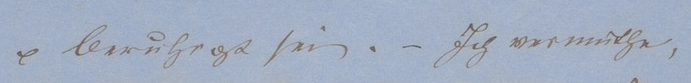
beruhigt sei. – Ich vermuthe,
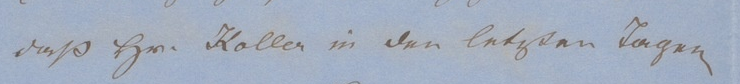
daß Hr. Koller in den letzten Tagen
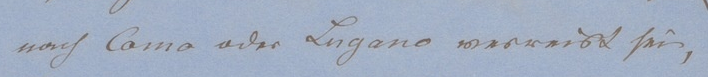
nach Como oder Lugano verreist sei,
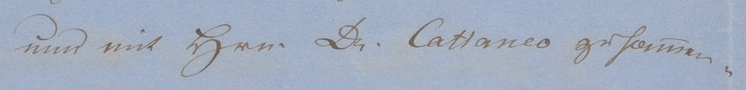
um mit Hrn. Dr. Cattaneo zusammen-
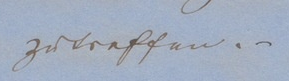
zutreffen. –
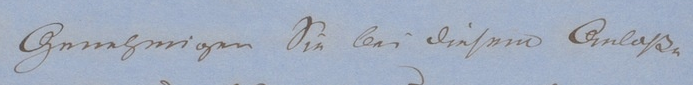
Genehmigen Sie bei diesem Anlaße
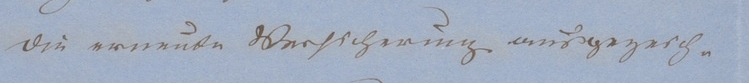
die erneute Versicherung ausgezeich-
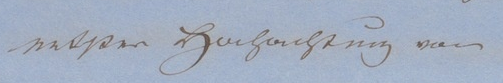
netster Hochachtung von
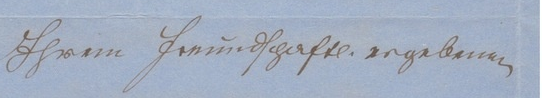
Ihrem freundschaftl. ergebenen
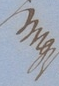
J.
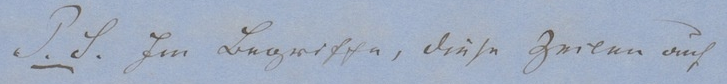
P. S. Im Begriffe, diese Zeilen auf
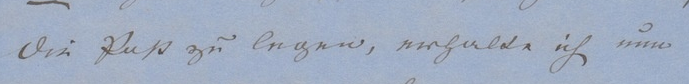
die Post zu legen, erhalte ich nun
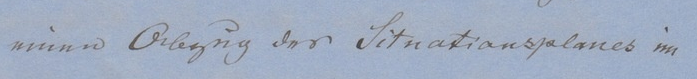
einen Abzug des Situationsplanes im
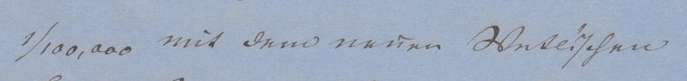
1/100,000 mit dem neuen Wetli'schen
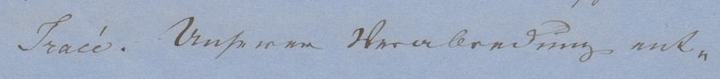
Tracé. Unserer Verabredung ent-
